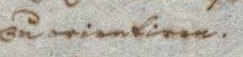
zu orientiren.
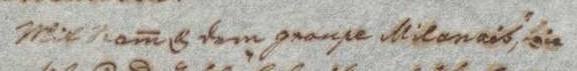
Mit Stamm & dem «groupe Milanais», wie
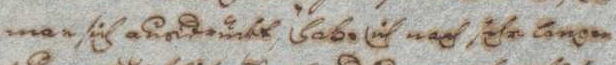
man sich ausdrückt, habe ich nach sehr langen
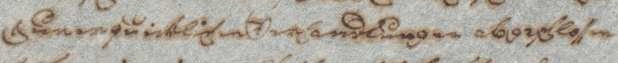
& unerquicklichen Verhandlungen abgeschlossen
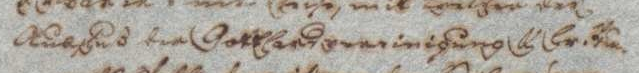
Ausschuß der Gotthardvereinigung & Hr. Bun-
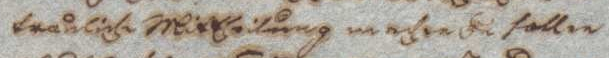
trauliche Mittheilung machen zu sollen
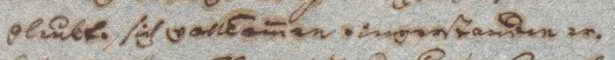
glaubte, sich vollkommen einverstanden er-
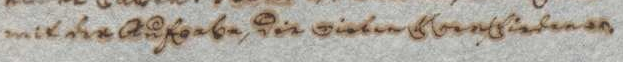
mit der Aufgabe, die vielen & verschiedenar-
